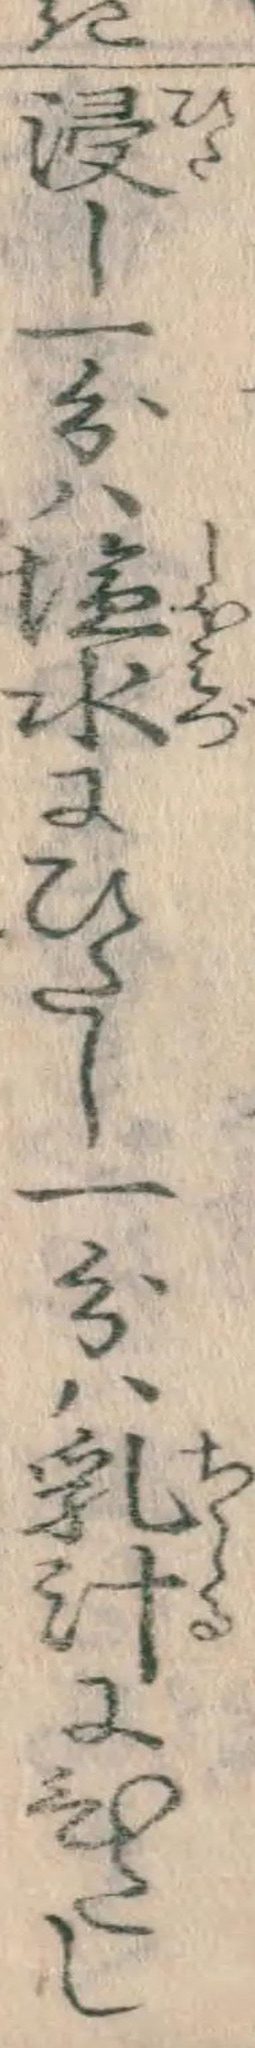浸し一分は塩水にひたし一分は乳汁にひたし
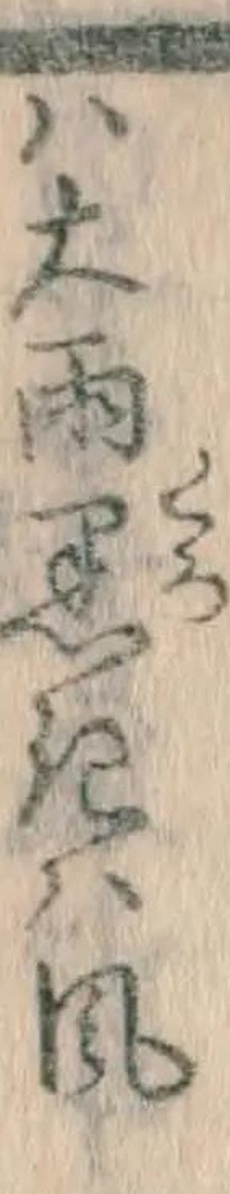は大雨黒きは風
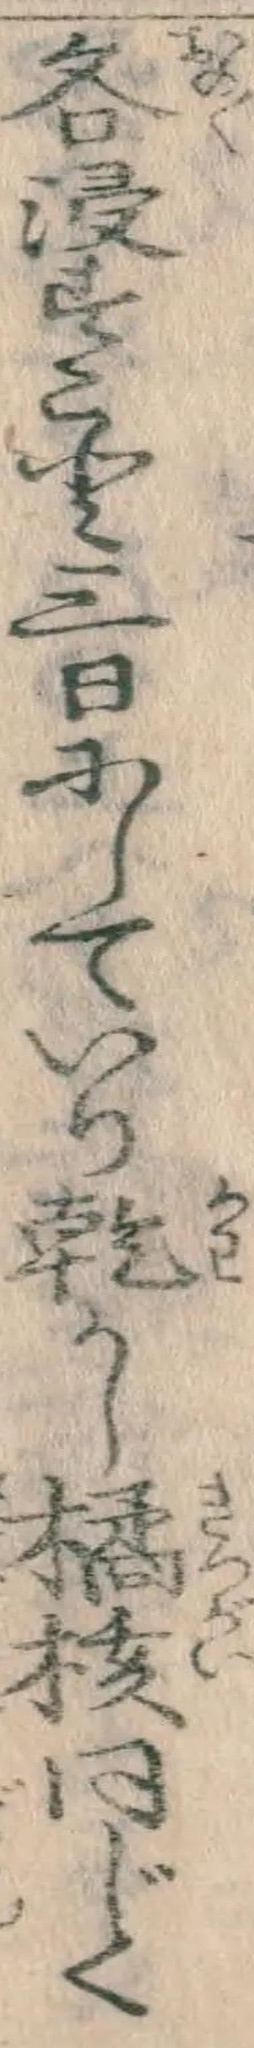各浸すこと三日にしていり乾かし橘核同じく
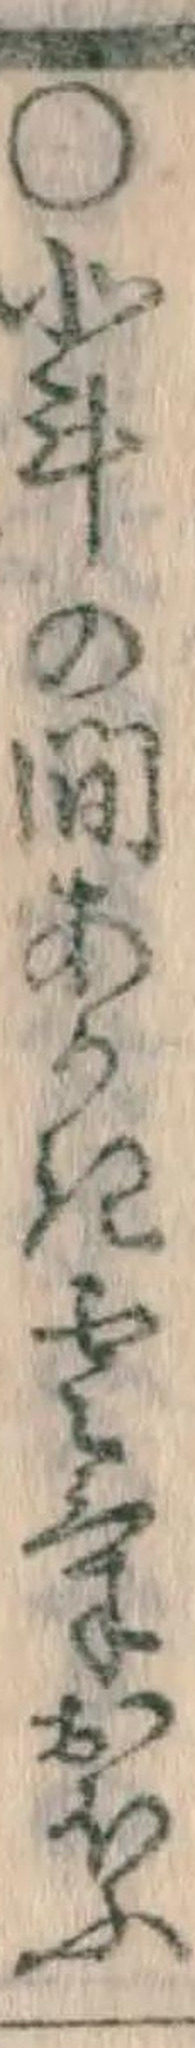○北斗の間あかき雲気おほふ
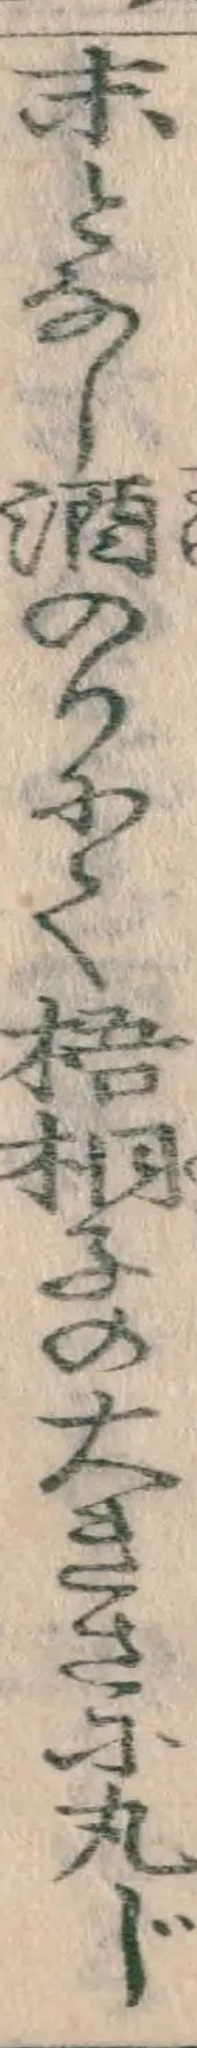末となし酒のりにて梧桐子の大きさに丸じ
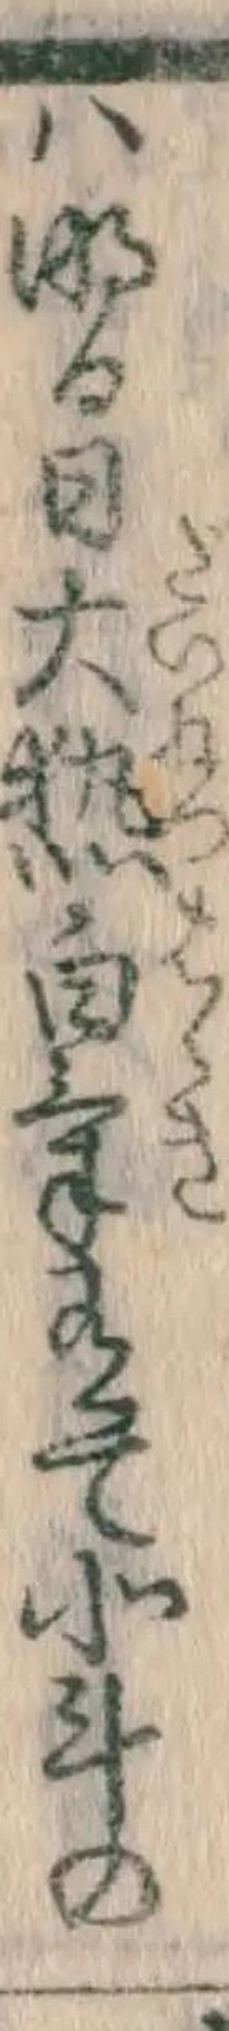は明る日大熱白気有て北斗の
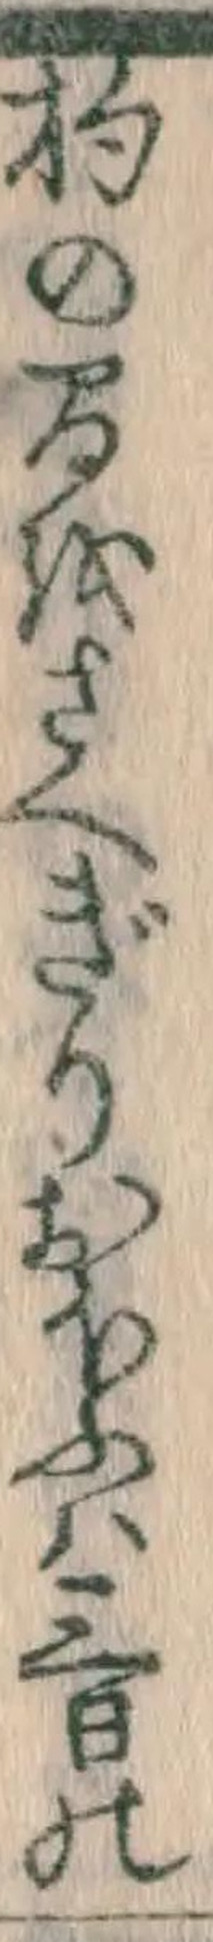杓の間をさへぎりおほふは三日の
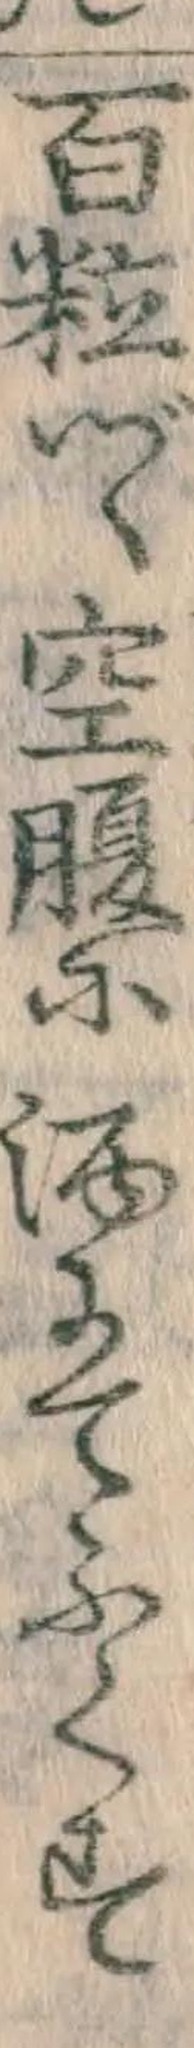百粒づゝ空腹に酒にてふくす
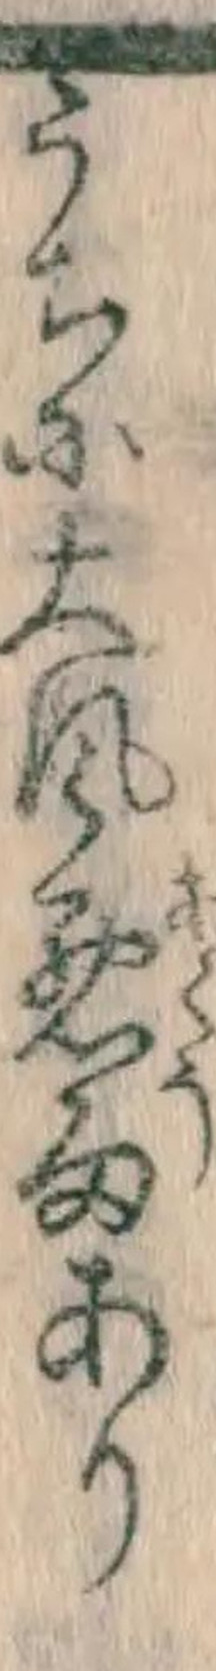うちに大風悪雨あり
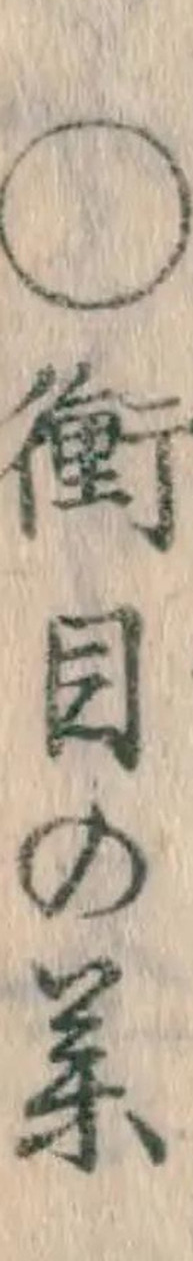○衝目の薬
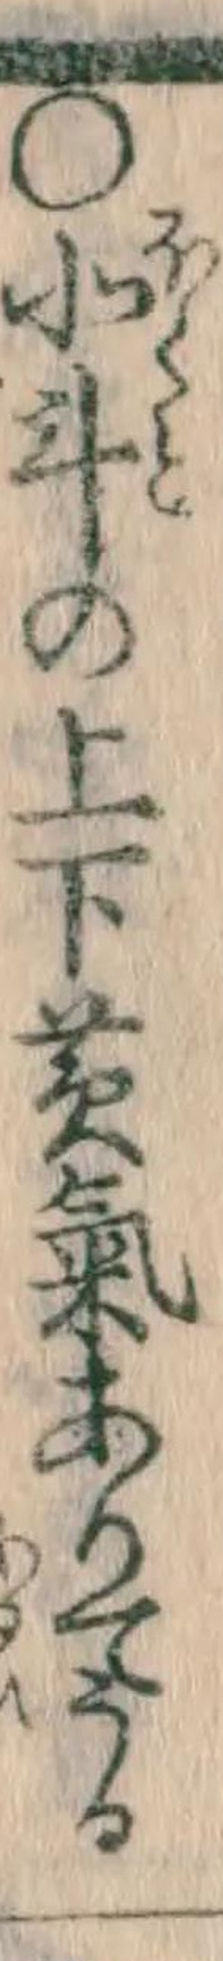○北斗の上下黄気ありてうる
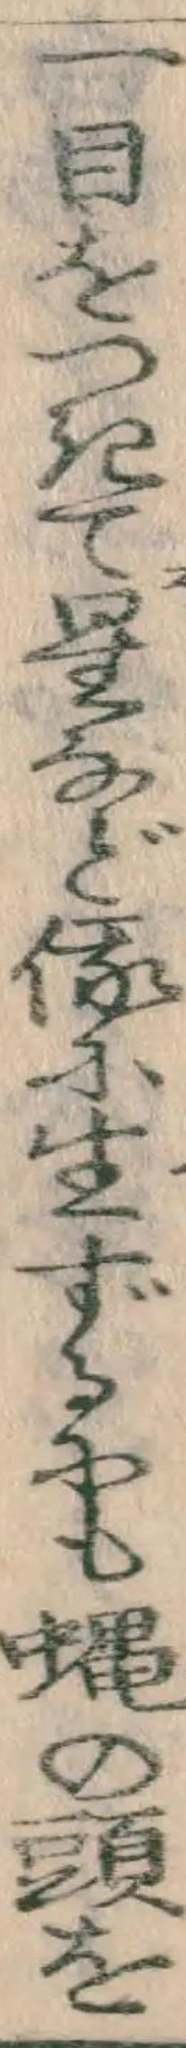一目をつきて星など俄に生ずるにも蝿の頭を
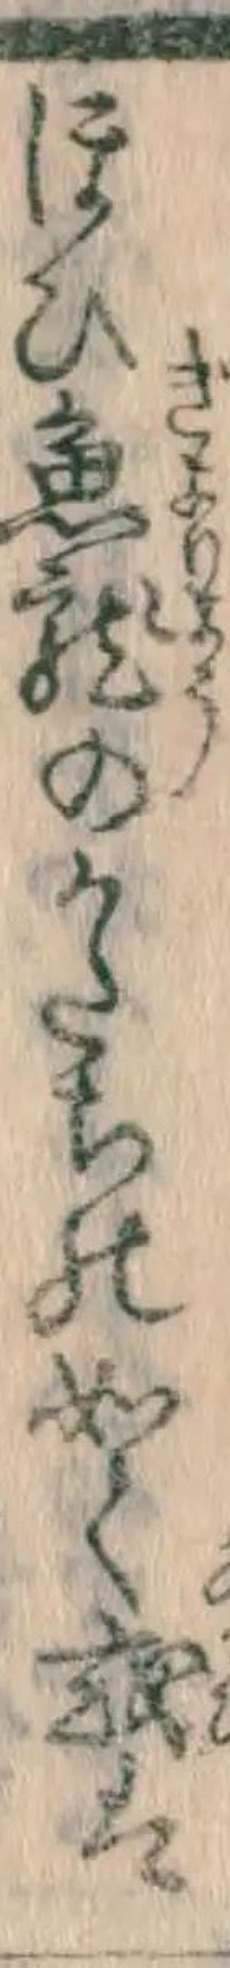ほひ魚龍のかたちの如く或は
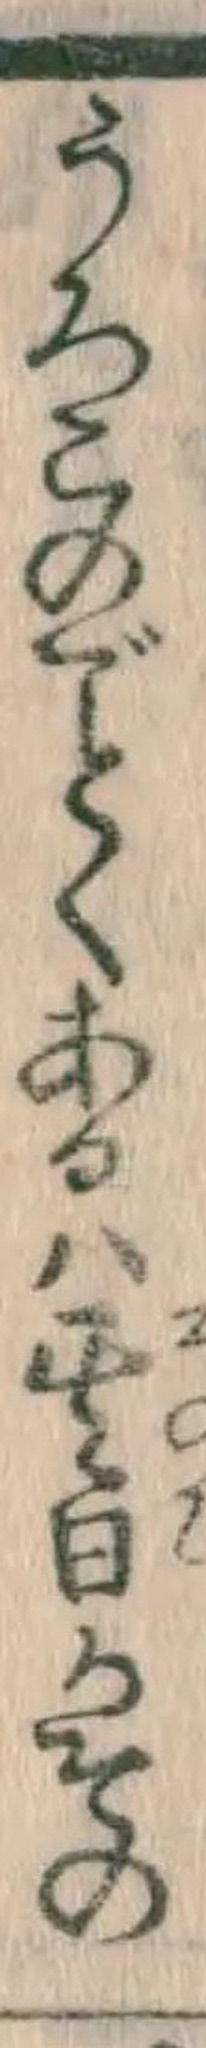うろこのごとくあるは其日かその
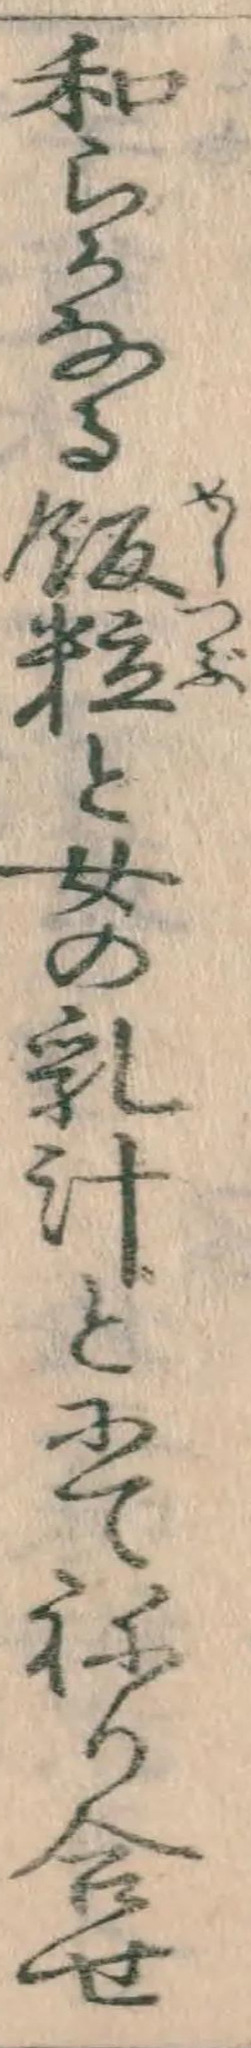和らかなる飯粒と女の乳汁とにてねり合せ
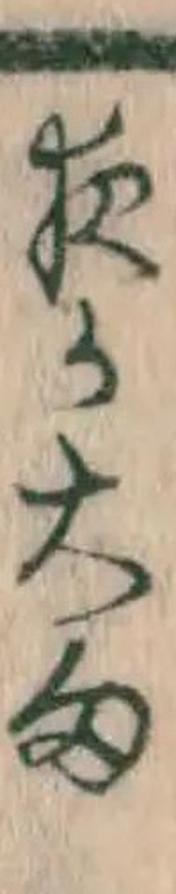夜か大雨
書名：広益秘事大全 3巻. [4]
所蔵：国立国会図書館 National Diet Library, JAPAN
